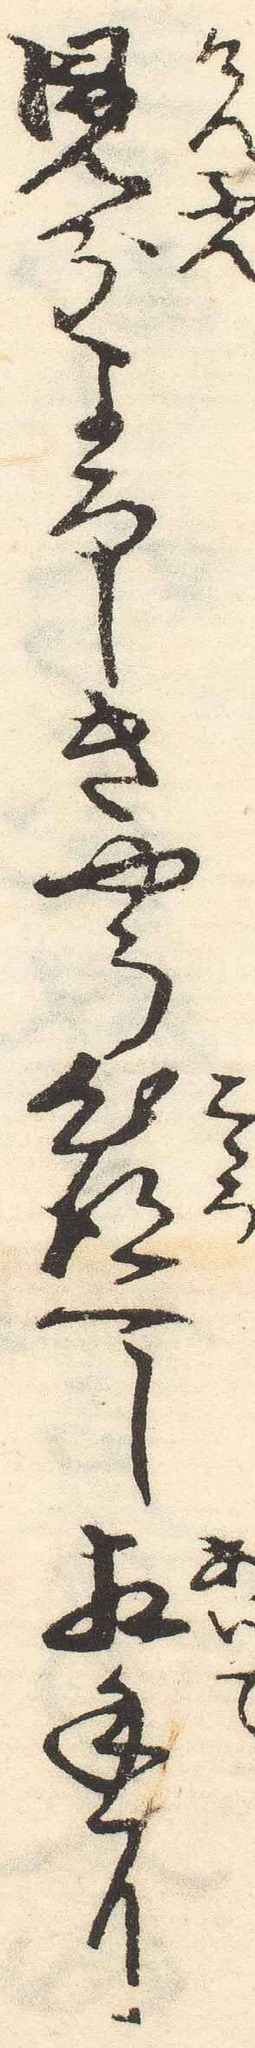見分よろしきやう心得へし相手に
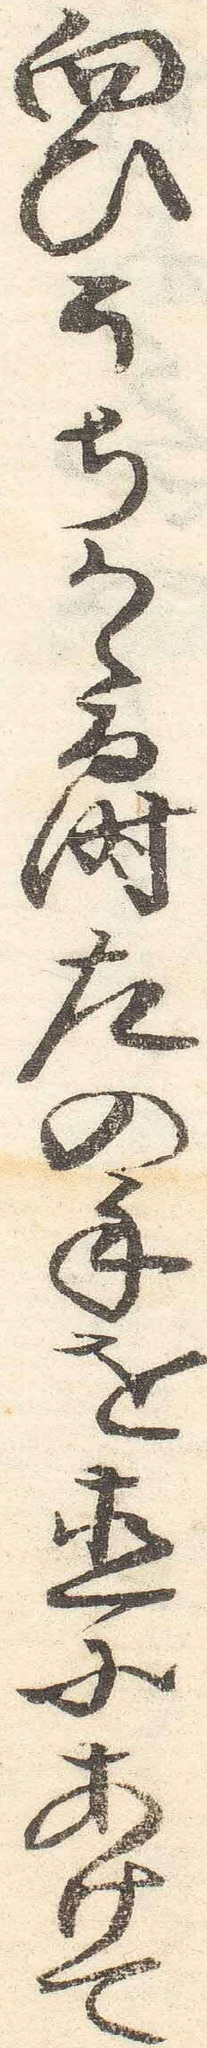向ひうちかゝる時左の手を直にあけて
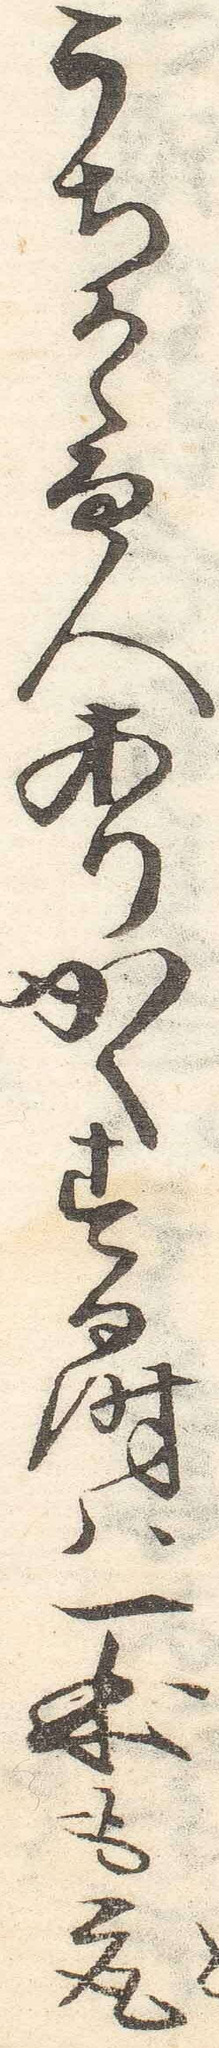うちかゝる人ありかくする時は一本も取
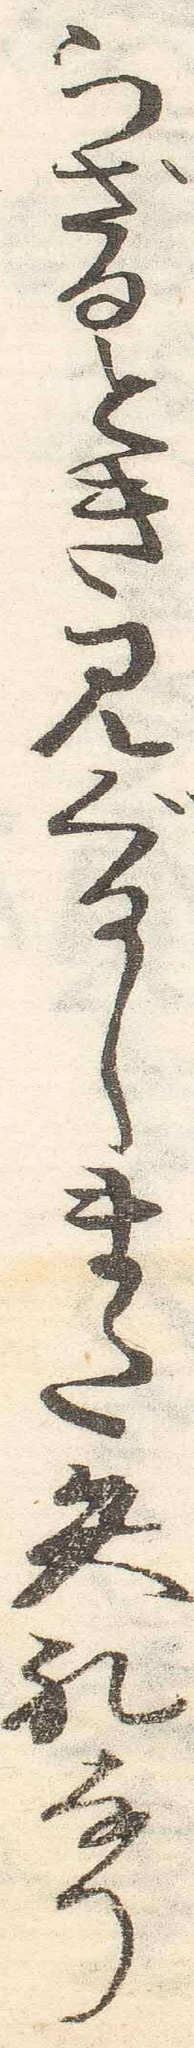らざるとき見ぐるしまた失礼なり
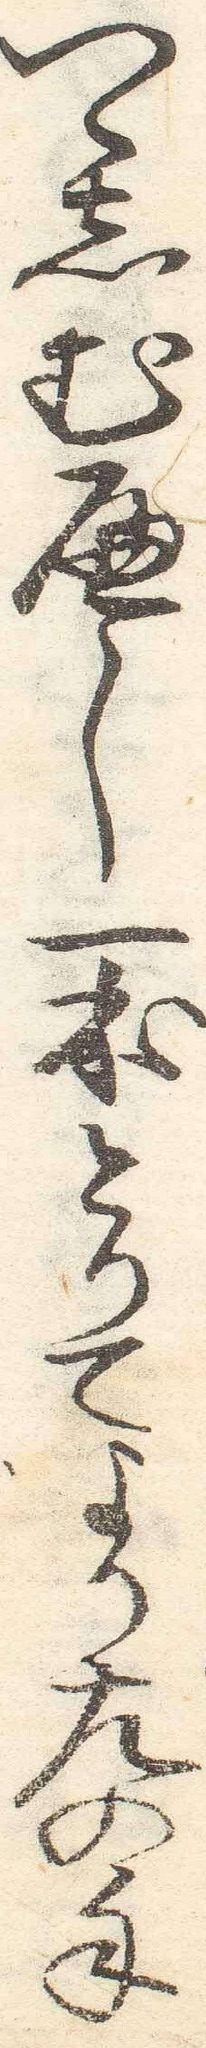つゝしむへし一本とりてより左の手
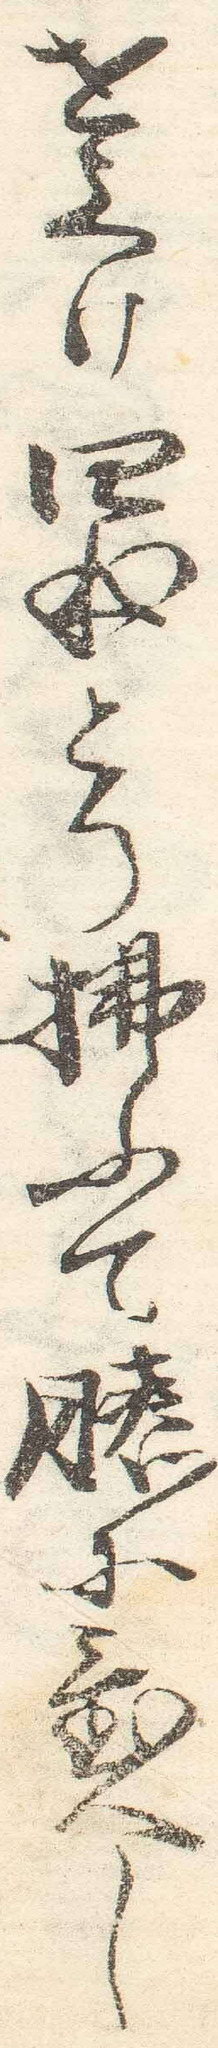を上け四本とり払ふて膝に置へし
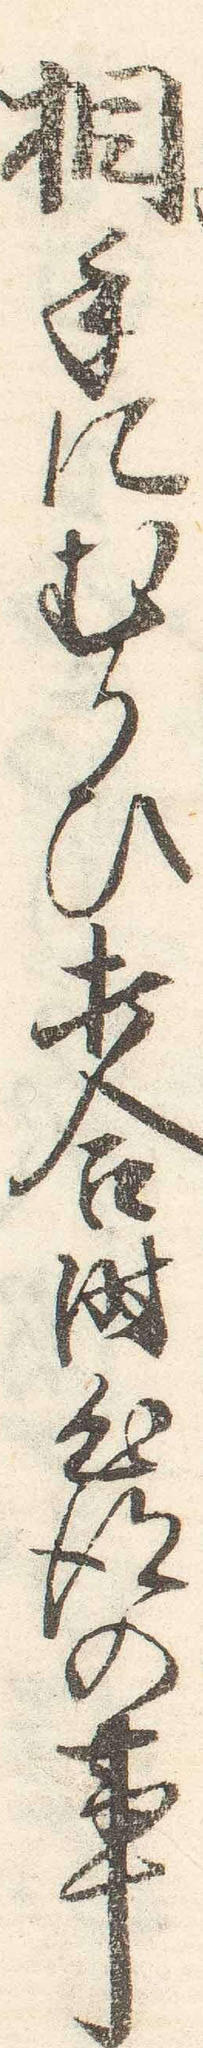一相手にむかひ打合時心得の事
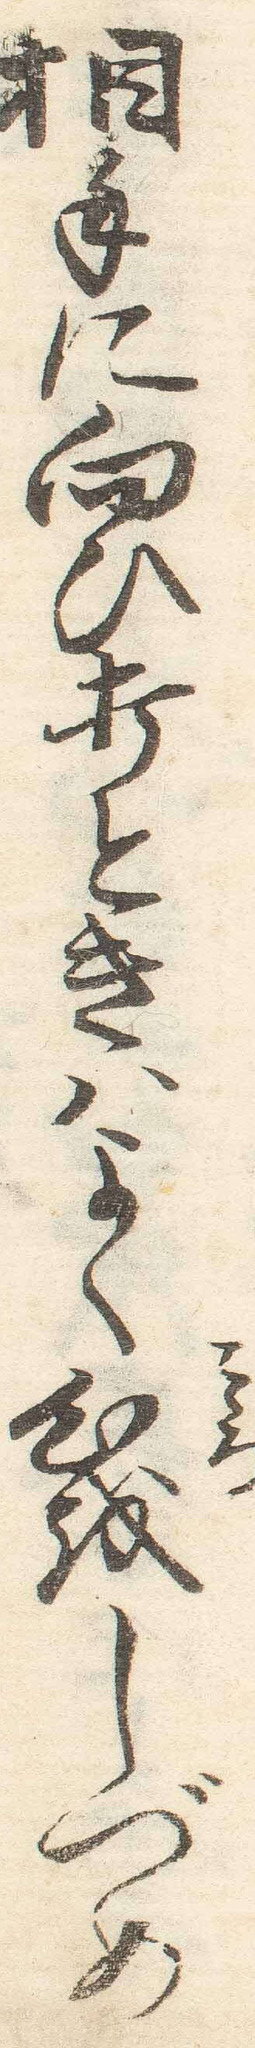相手に向ひ打ときはよく心をしづめ

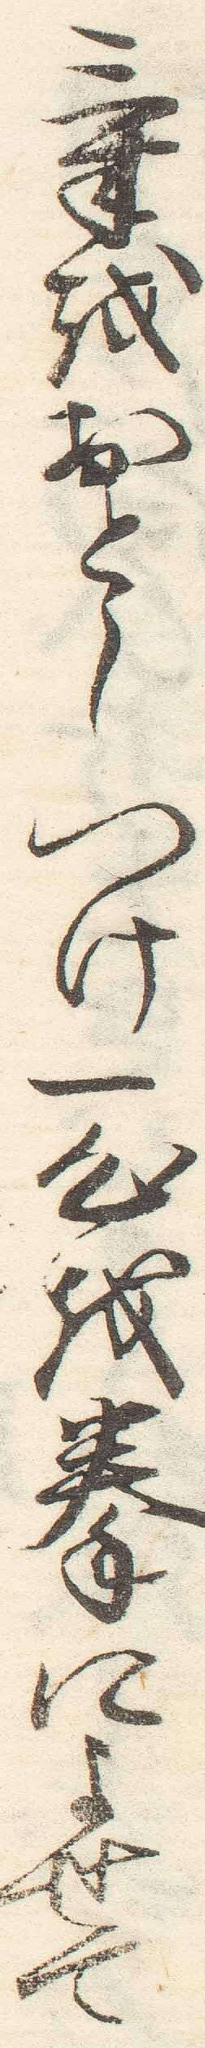気をおとしつけ一心を拳によせて
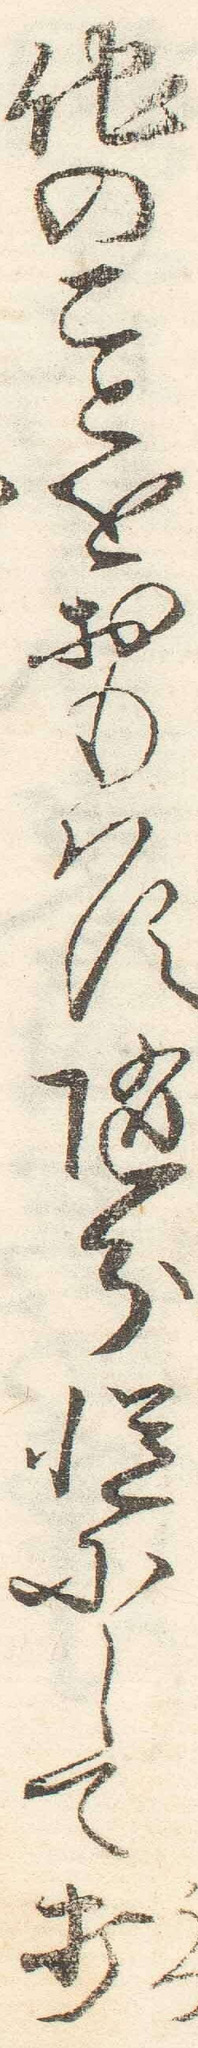他のことをおもはす随分慥にして打
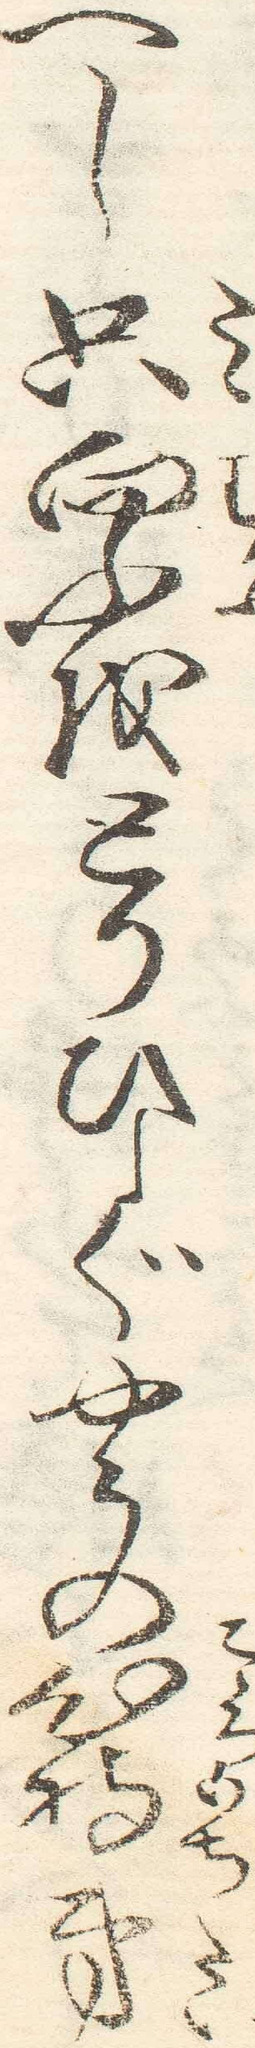へし只向ふをとりひしぐやうの心持第
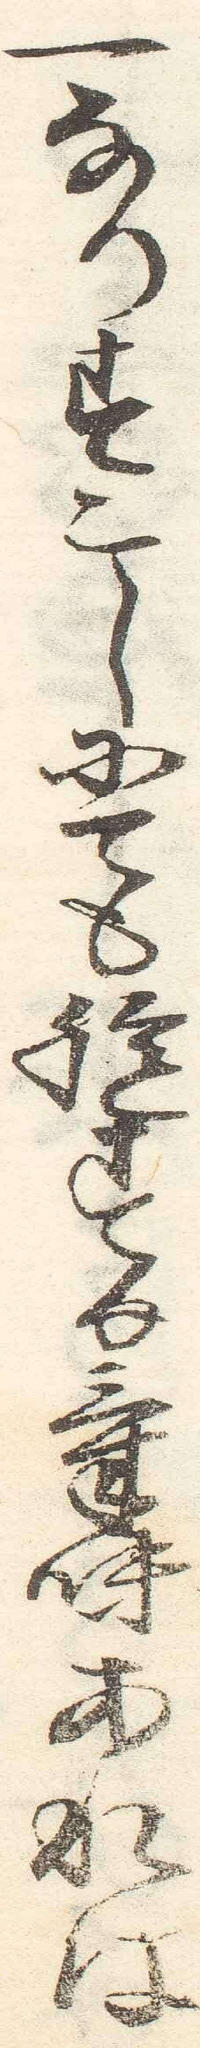一なりすこしにても臆する気味あれは
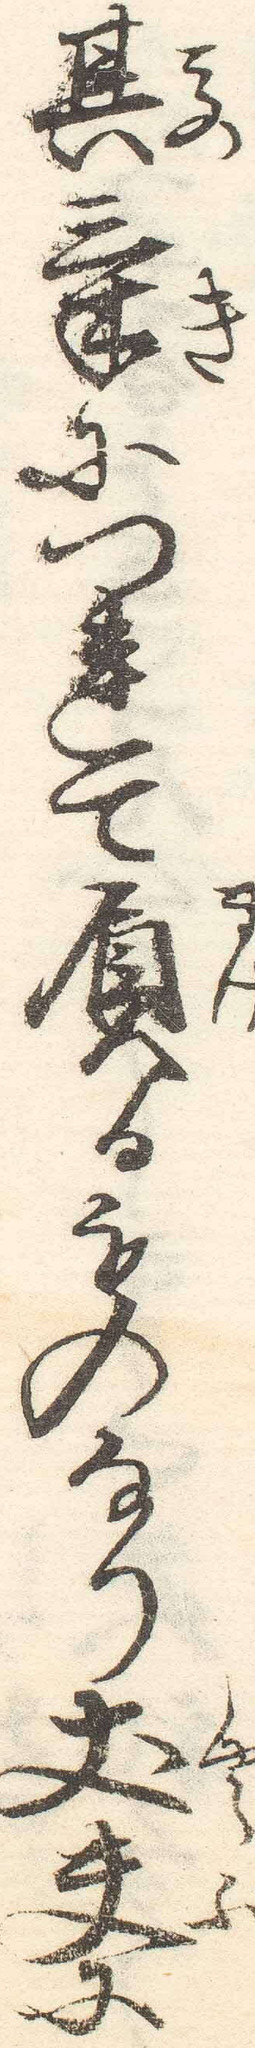其気につれて負るものなり丈夫に
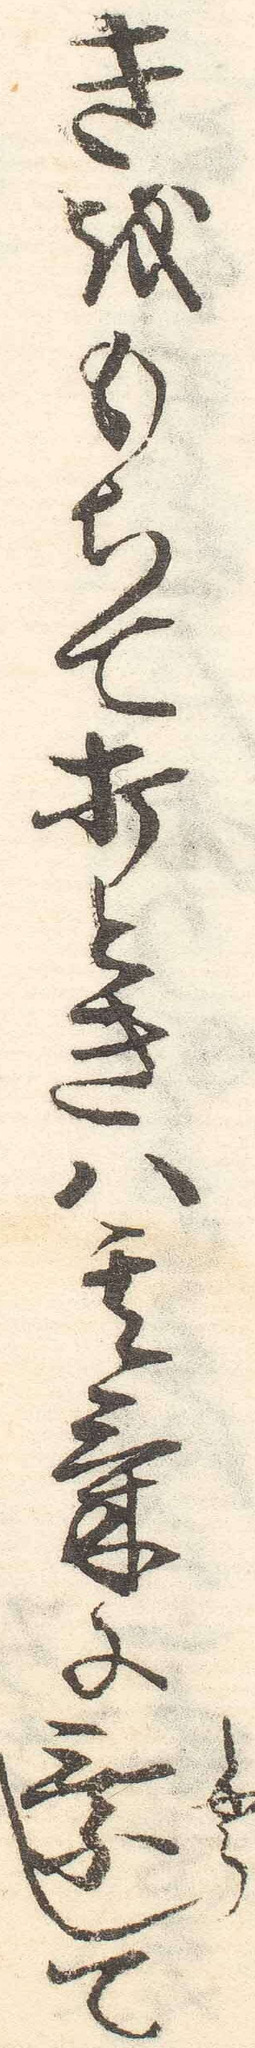きをもちて打ときは其気に乗して
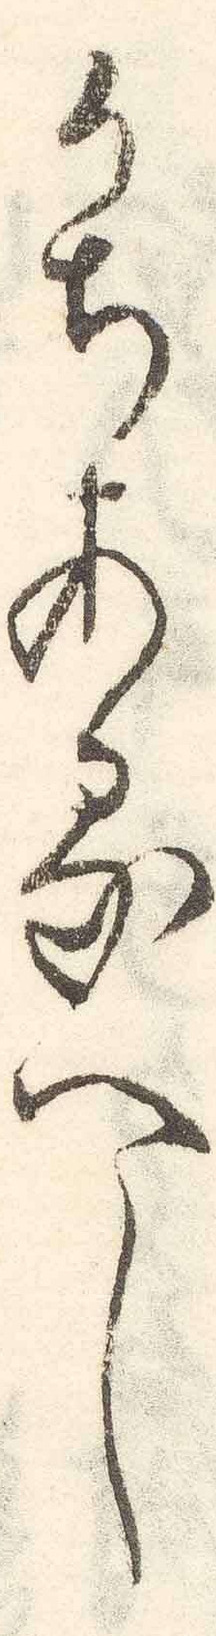かちあるへし
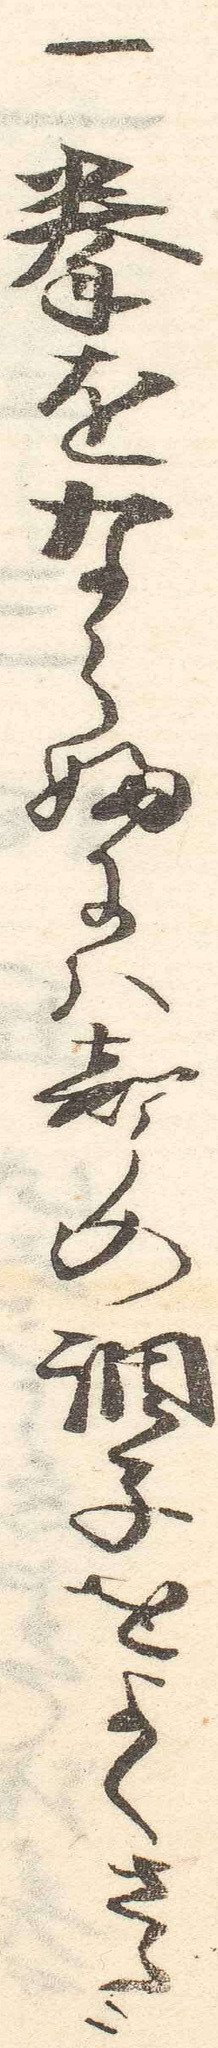一拳をならふるは声の調子をよくさた
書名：拳独稽古
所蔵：東京学芸大学附属図書館 国文学研究資料館
